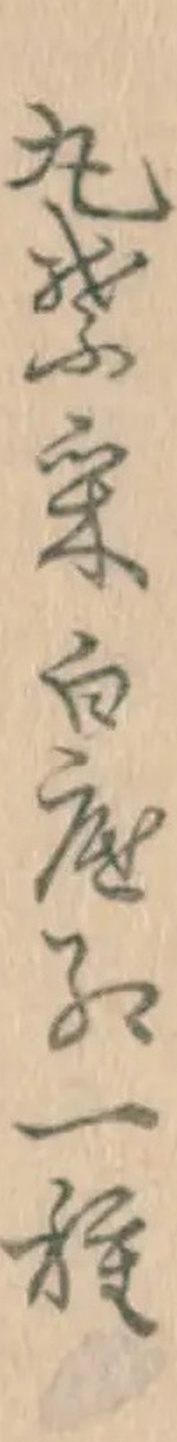丸葉采白底紅一種
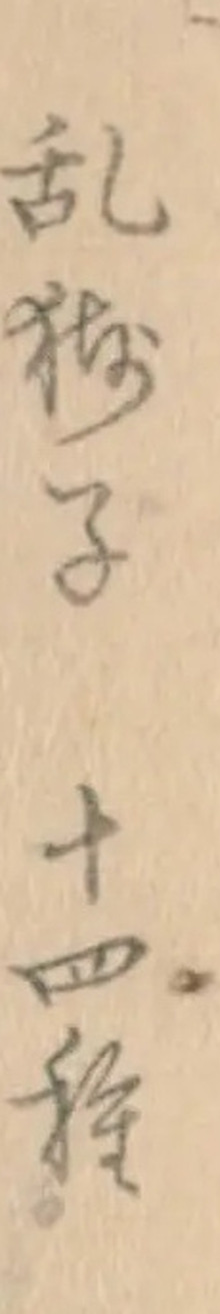乱獅子十四種
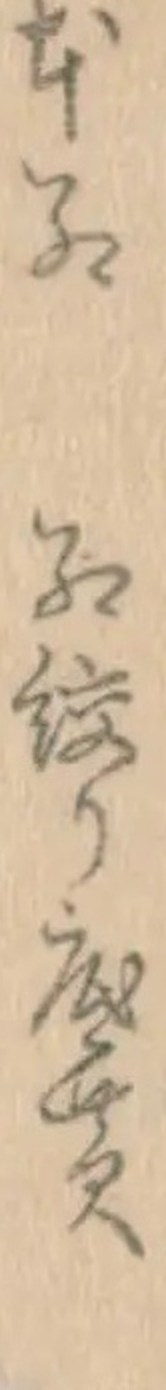本紅紅絞り底黄
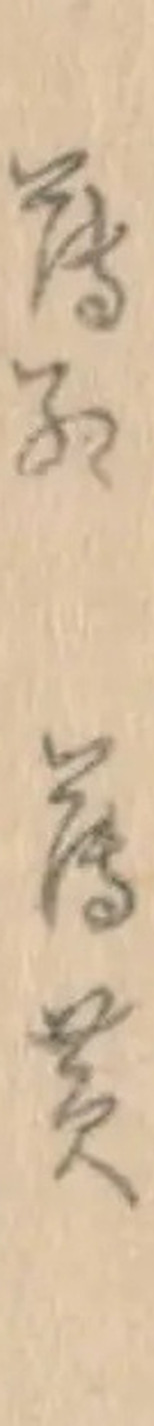薄紅薄黄

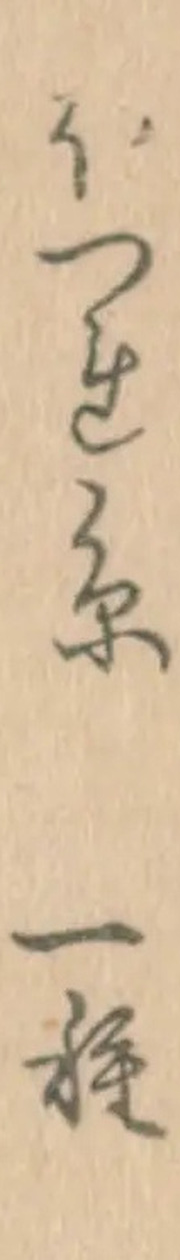ほつれ糸一種
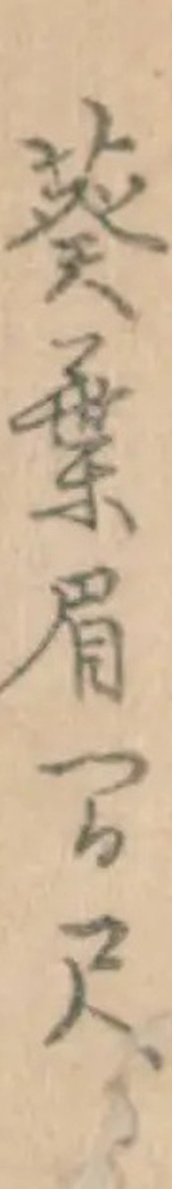葵葉眉間尺

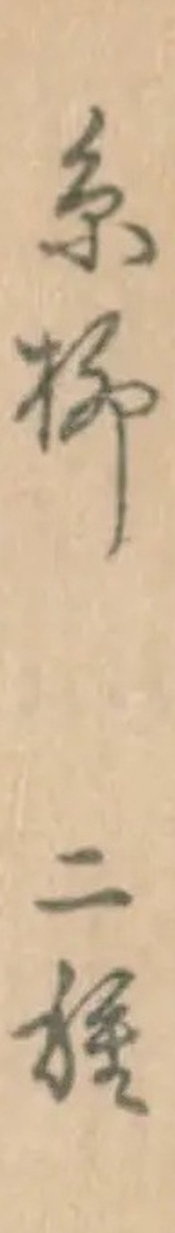糸柳二種
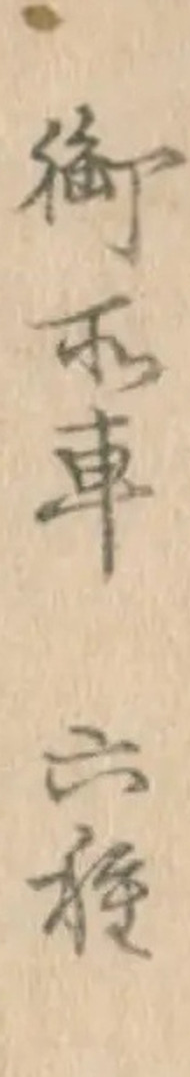御所車六種

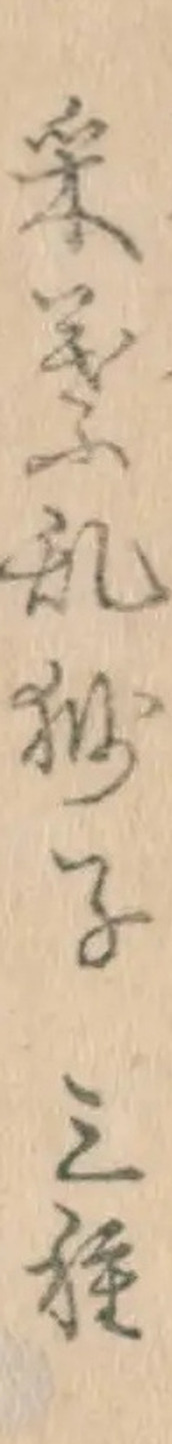采葉乱獅子三種
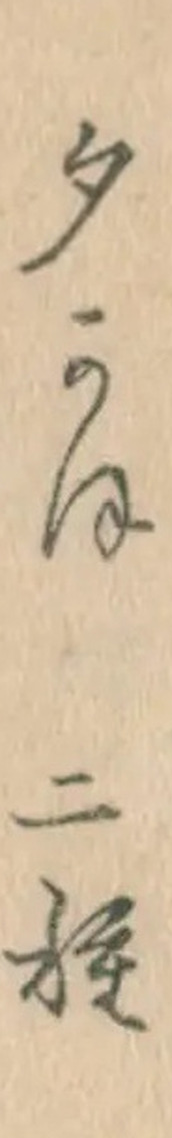夕かほ二種
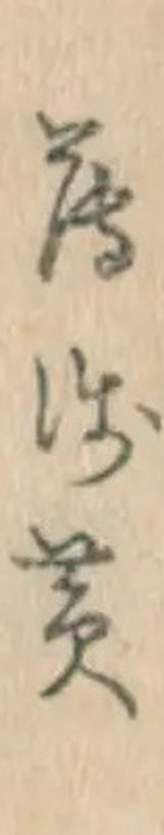薄浅黄

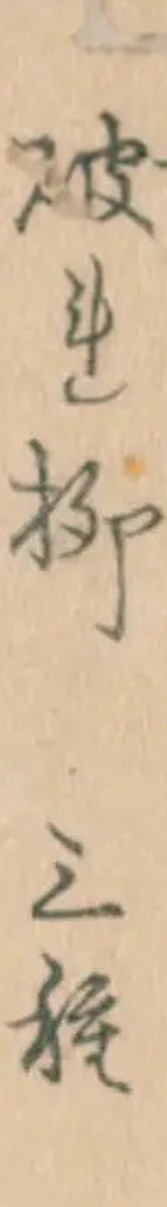破れ柳三種
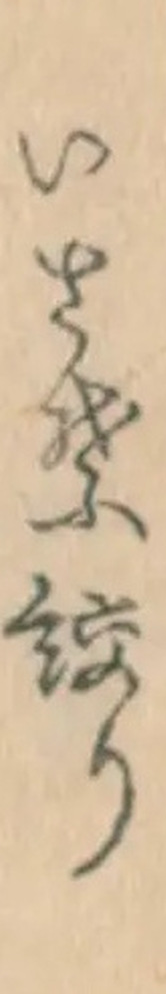いさ葉絞り
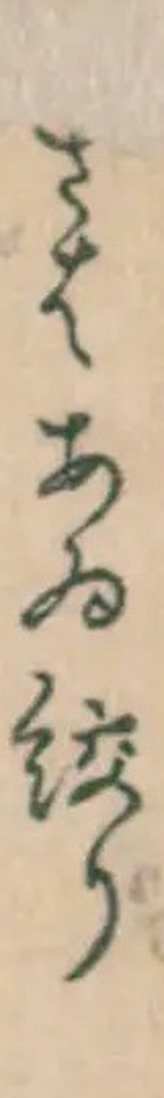さはあゐ絞り
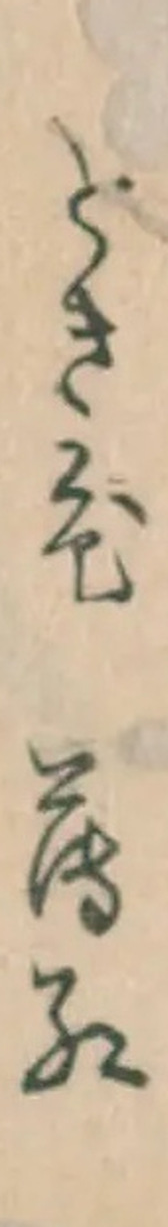とき色薄紅
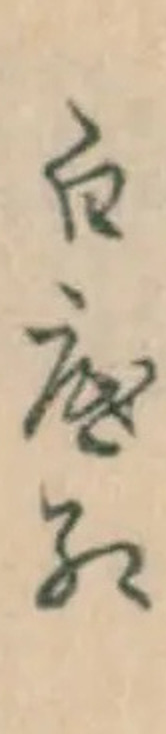白底紅
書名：朝顔叢. 上巻
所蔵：国立国会図書館 National Diet Library, JAPAN
